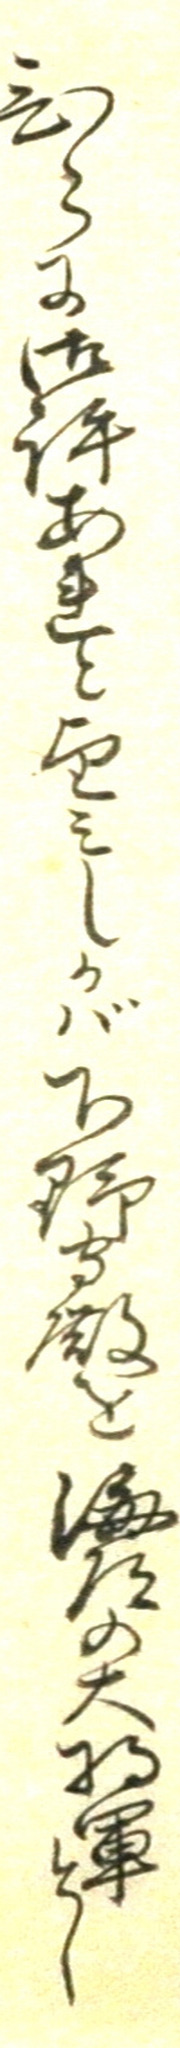ひらに御許あれと望みしかば下野守殿を海道の大将軍とし
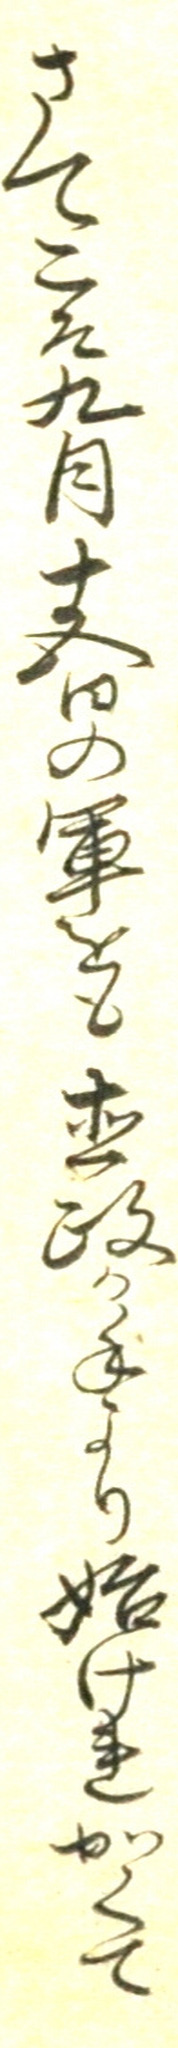さてこそ九月十五日の軍をも直政か手より始けれかくて
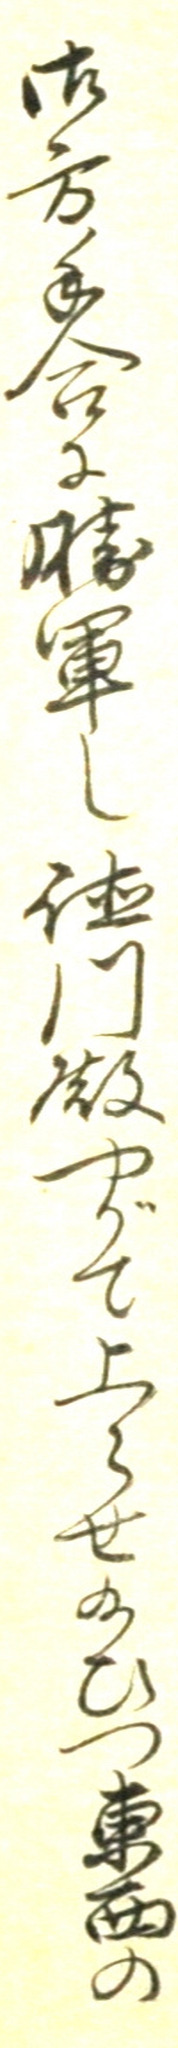御方手合に勝軍し徳川殿やがて上らせ給ひつ東西の
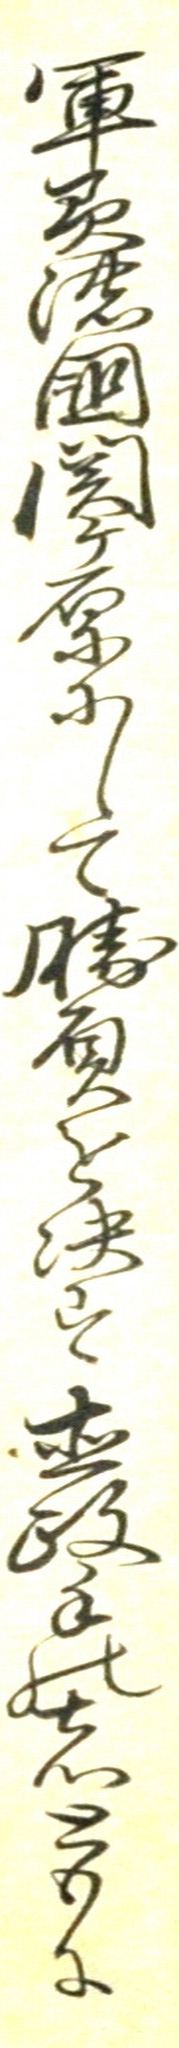軍美濃国関ヶ原にして勝負を決す直政手の者ともに
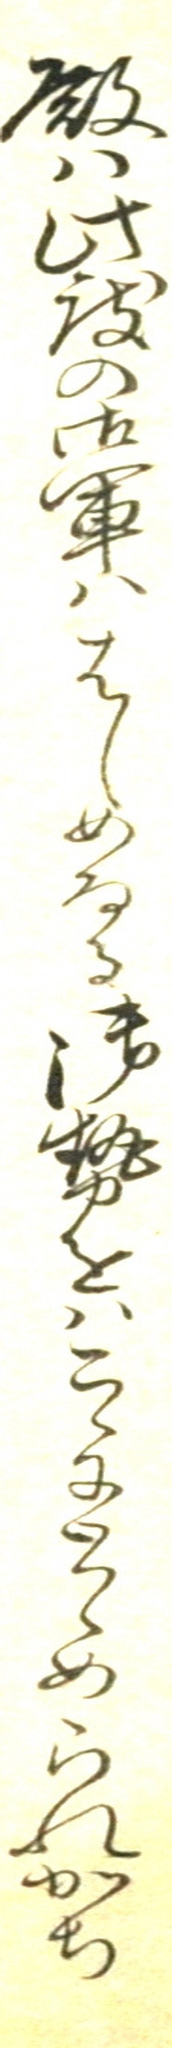殿は此度の御軍ははしめなる御勢をはこゝにとゝめられかち
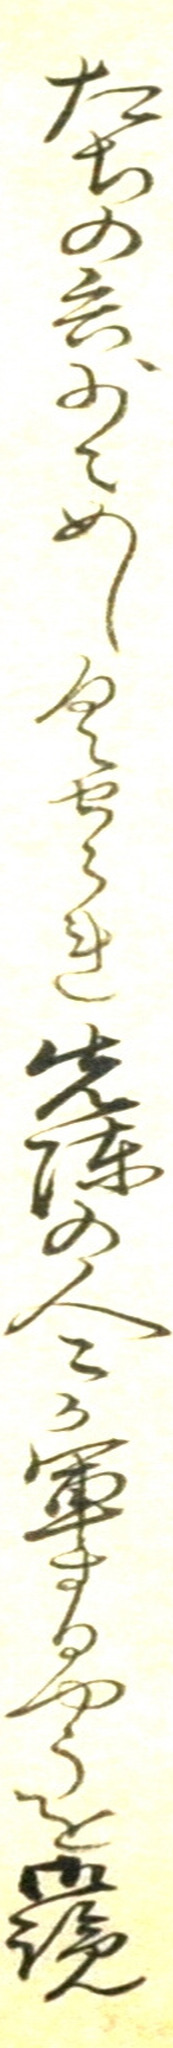たちの兵少々めし具せられ先陣の人々か軍するやうを御覧
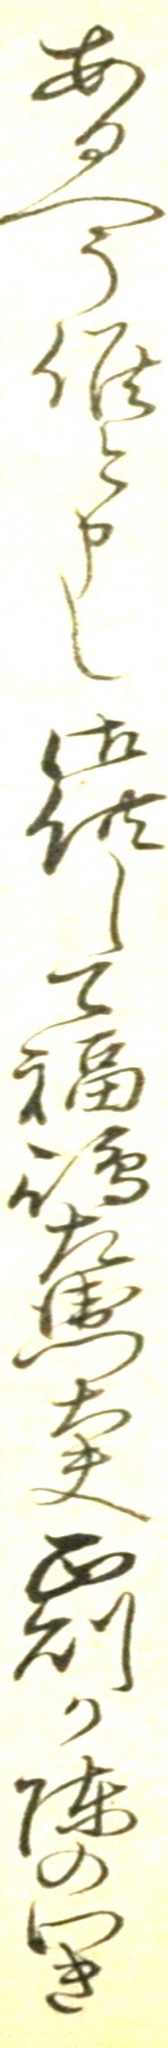あるへう候と申し御供して福島左衛門大夫正則か陣のわき
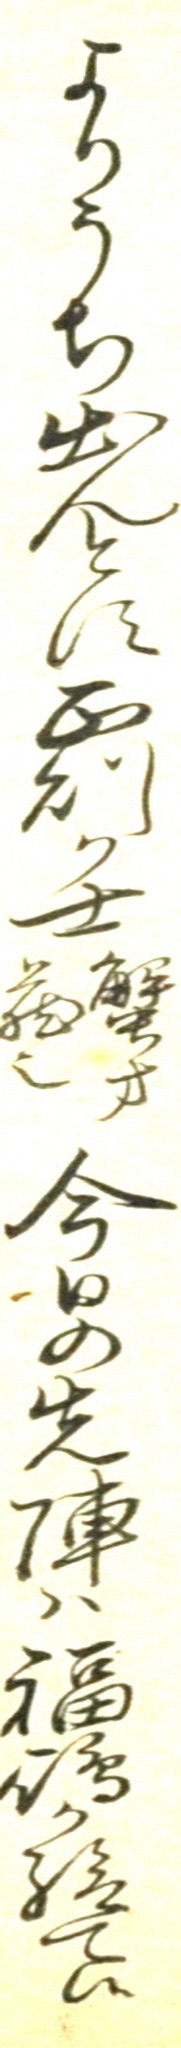よりうち出んとす正則か士蟹才蔵也今日の先陣は福島か給て候
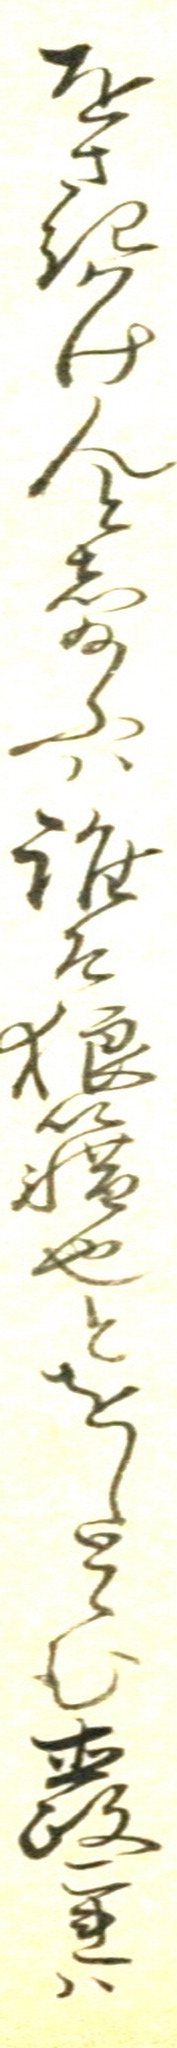をさきかけんとし給ふは誰そ狼藉也とをしとゝむ直政これは
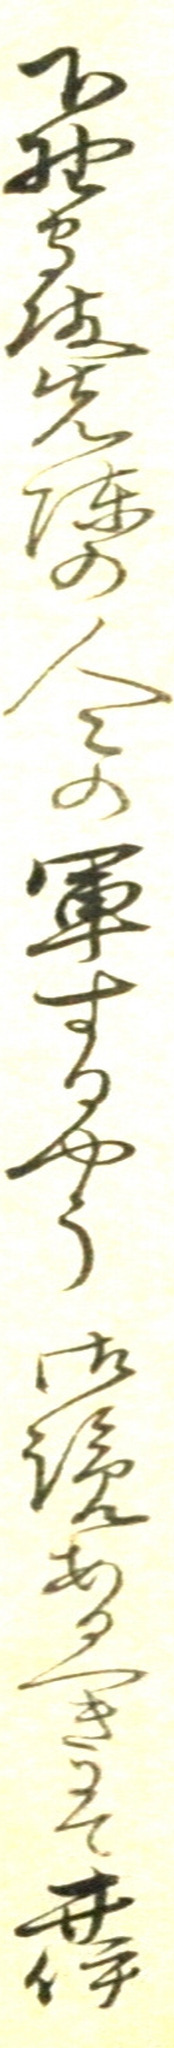下野守殿先陣の人々の軍するやう御覧あるへきにて井伊
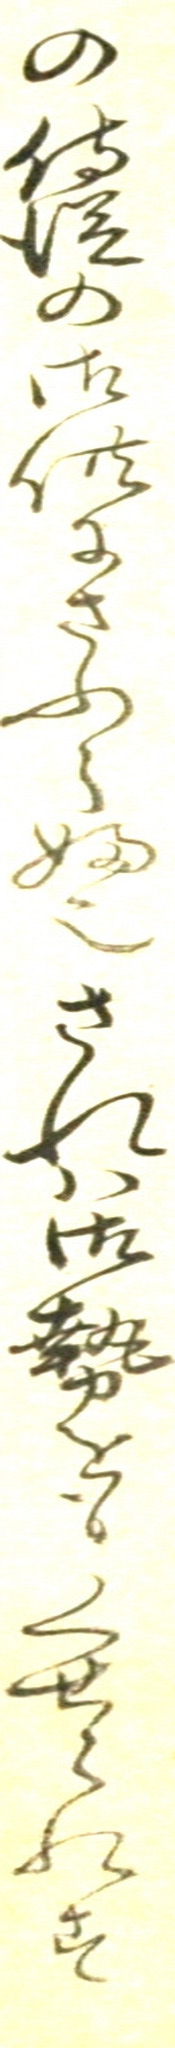の侍従の御供にさふらふ也されは御勢をもくせられす
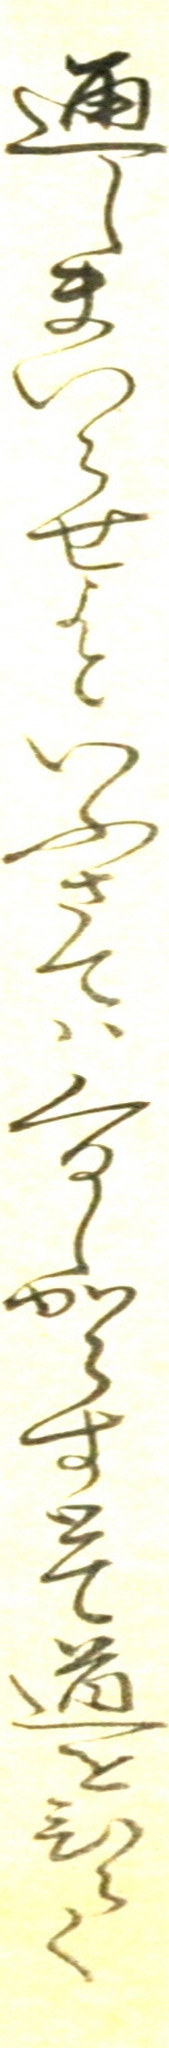通しまいらせよといふさてはくるしからすとて道をひらく

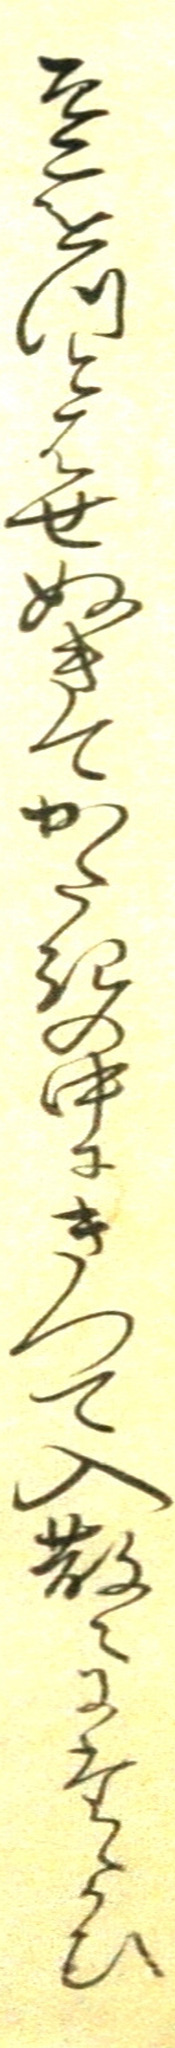そこをつとはせぬきてかたきの中にきつて入散々にたゝかひ
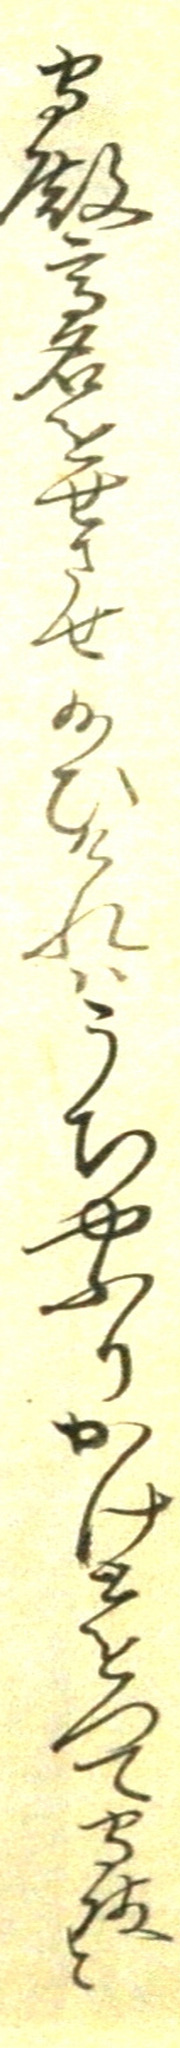守殿高名をせさせ給ひけれはうちやふりかけとをつて守殿と
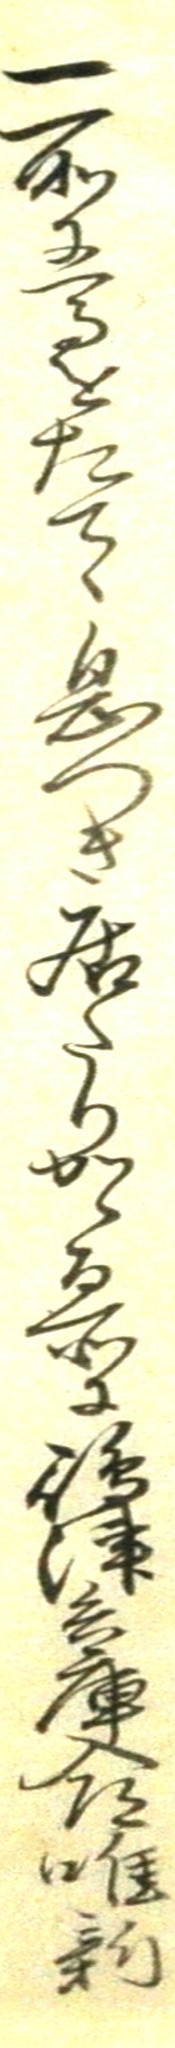一所に馬をたてゝ息つき居たりかゝる所に島津兵庫入道唯新
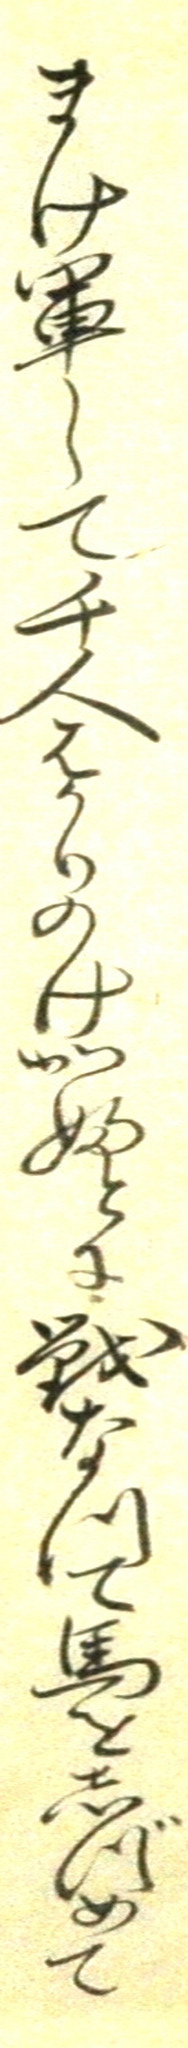まけ軍して千人はかりのけかふとに戦なつて馬をしづめて
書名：藩翰譜（四・上）
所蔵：伊那市立高遠町図書館・合同会社AMANE
